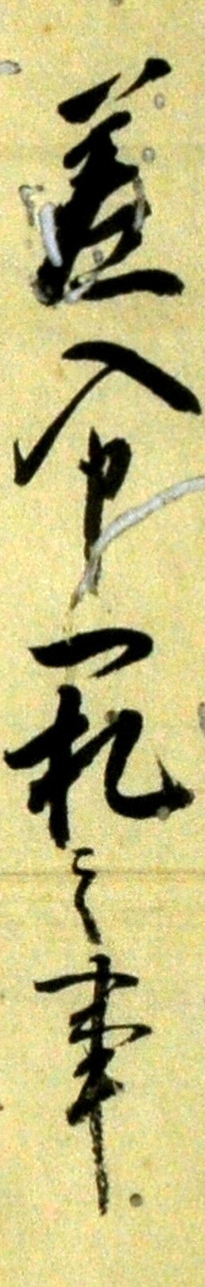差入申一札之事
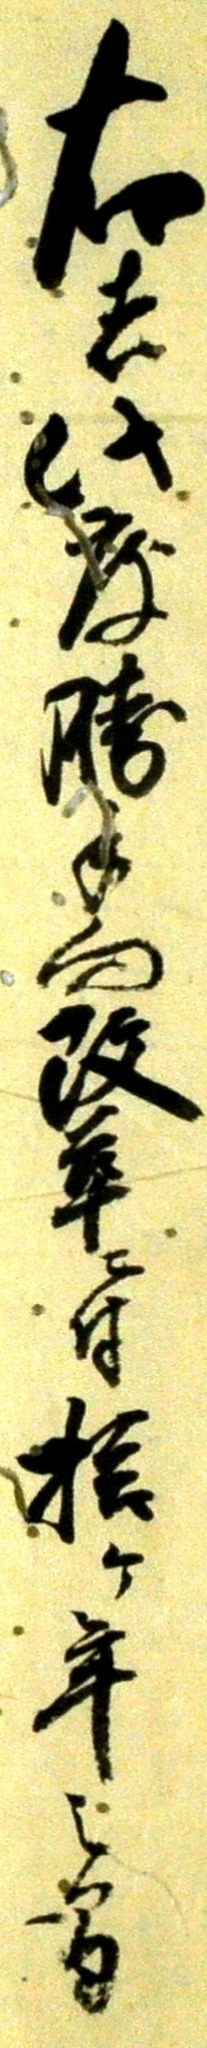右者此度勝手向改革ニ付、拾ケ年之間
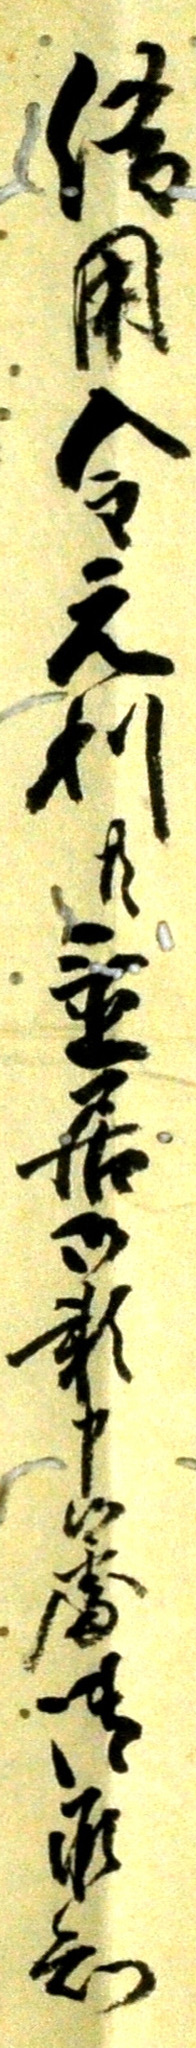借用金元利共置居御頼申候処、御承知
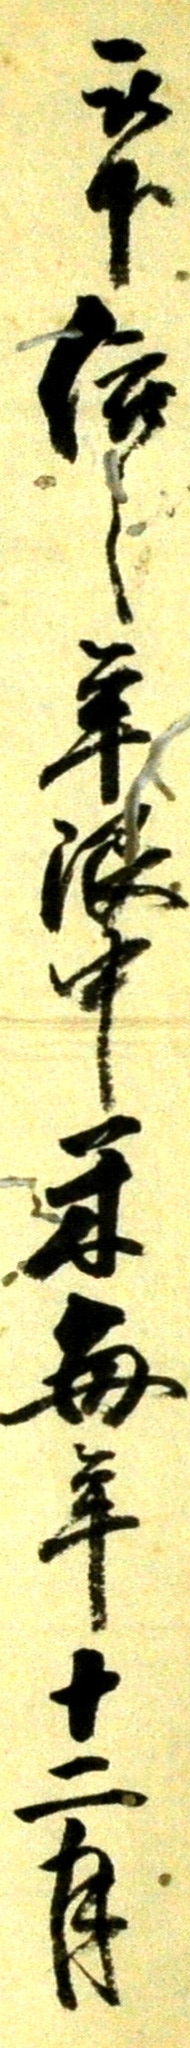被下依之年限中米毎年十二月
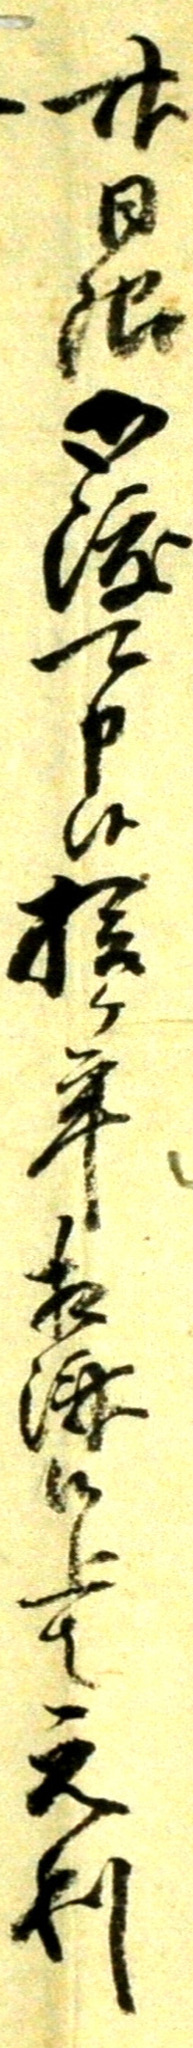廿日限御渡可申候拾ケ年相済候上者元利
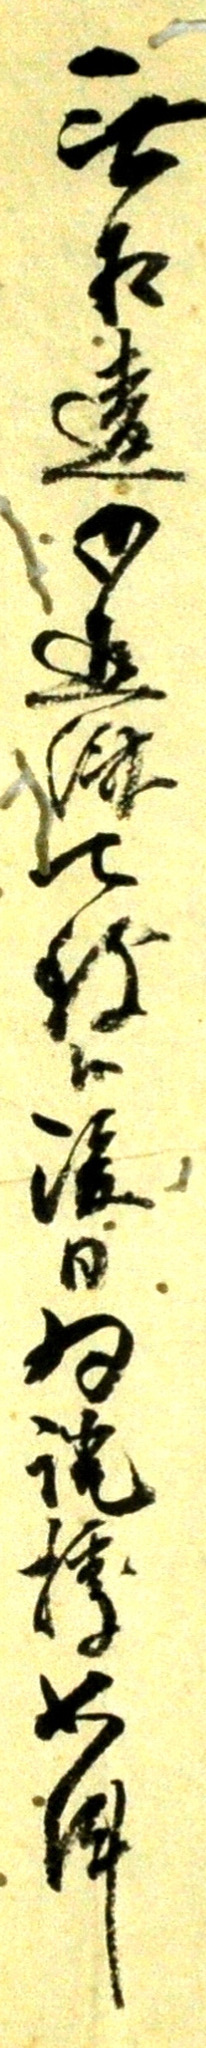無相違御返済可致候後日為証拠如件
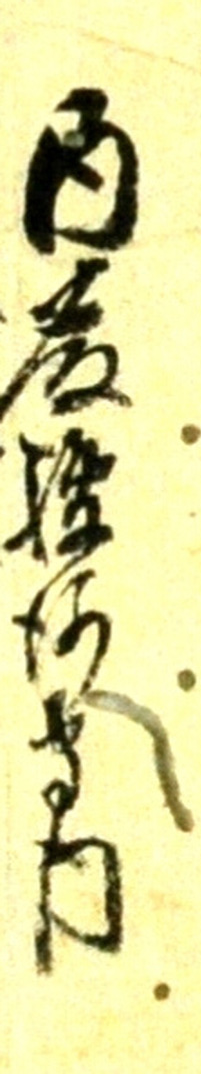内藤駿河守内
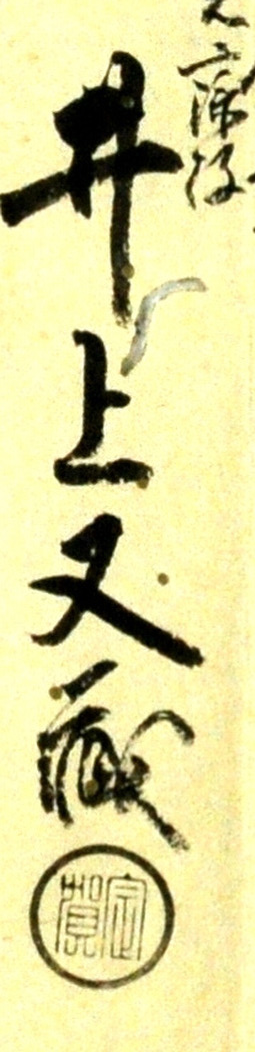井上又蔵
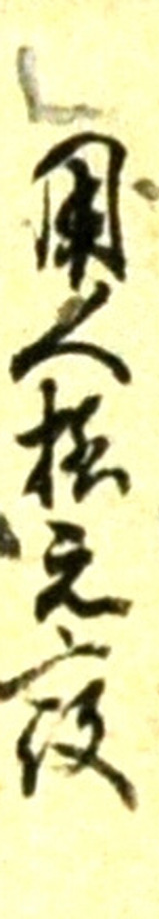用人格元〆役
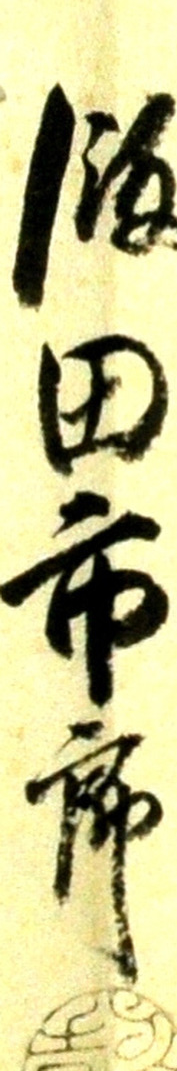飯田市郎
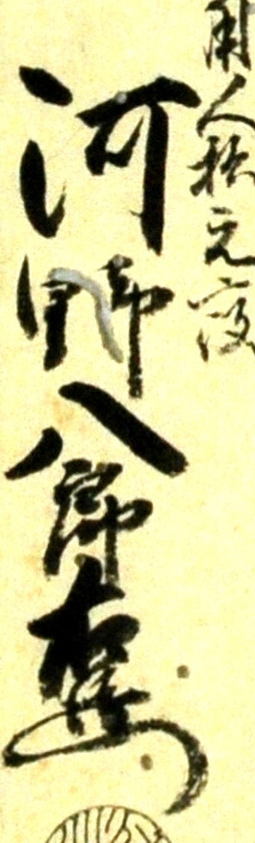河野八郎右衞門
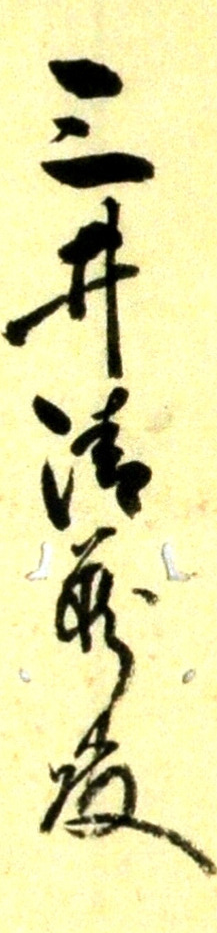三井清蔵殿
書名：差入申一札之事
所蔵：伊那市立高遠町図書館・合同会社AMANE
